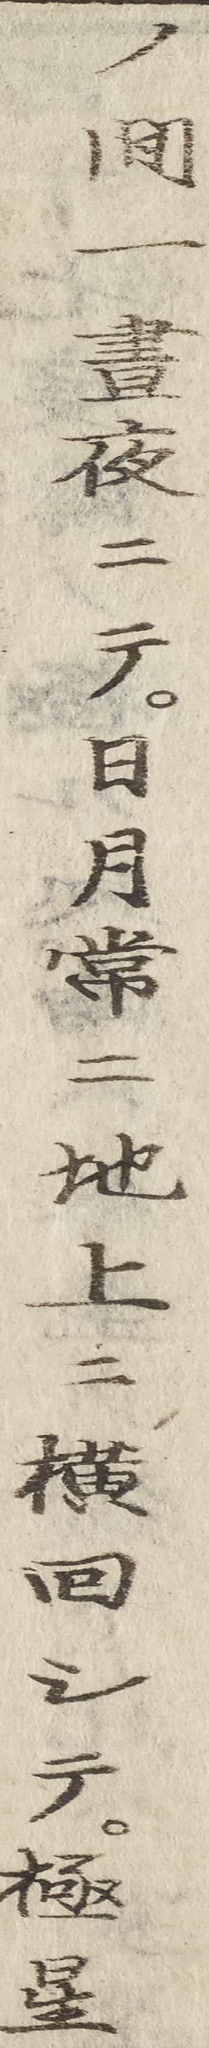ノ間一昼夜ニテ。日月常ニ地上ニ横回シテ。極星
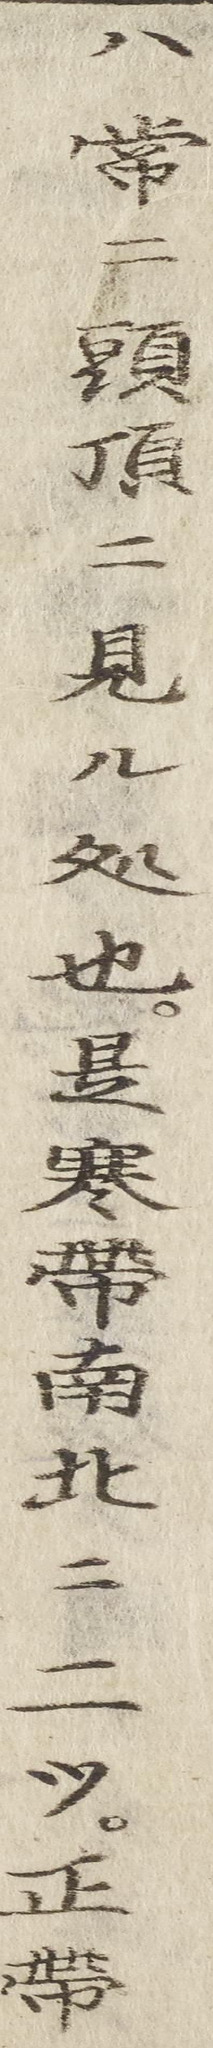ハ常ニ頭頂ニ見ル処也。是寒帯南北ニ二ツ。正帯
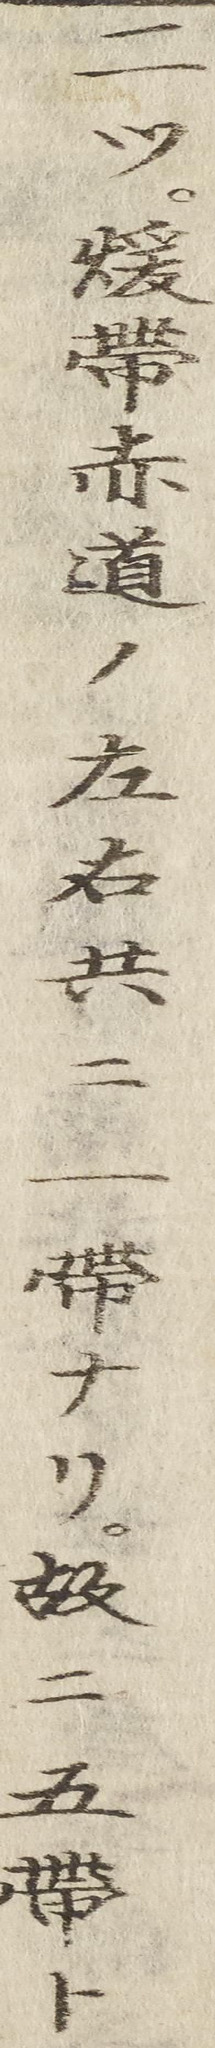二ツ。煖帯赤道ノ左右共ニ一帯ナリ。故ニ五帯ト
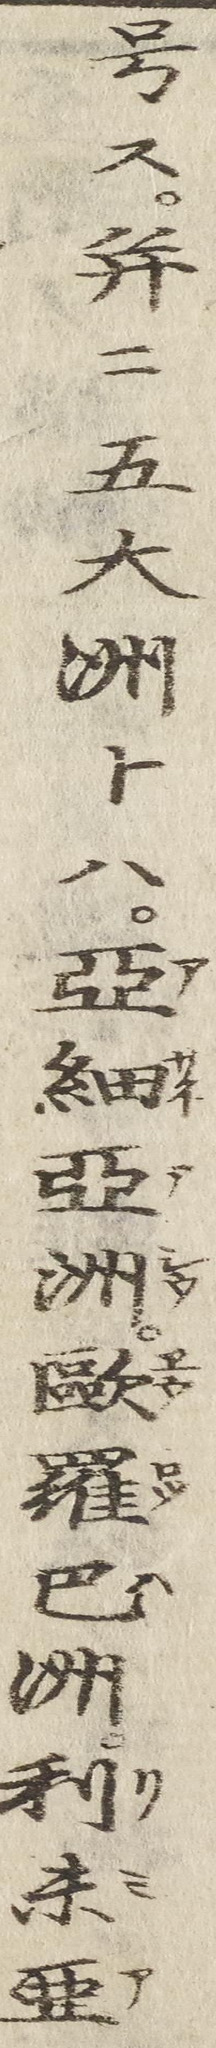号ス。并ニ五大洲トハ。亜細亜洲。欧羅巴洲。利未亜
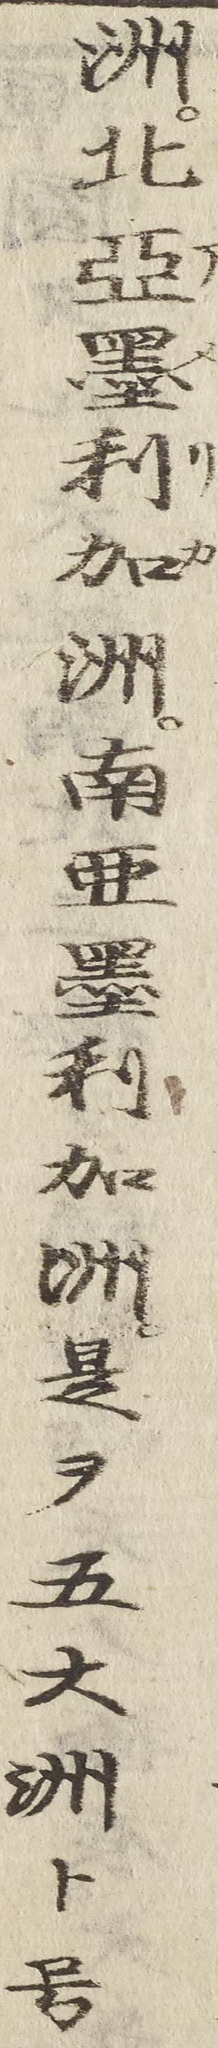洲。北亜墨利加洲。南亜墨利加洲。是ヲ五大洲ト号
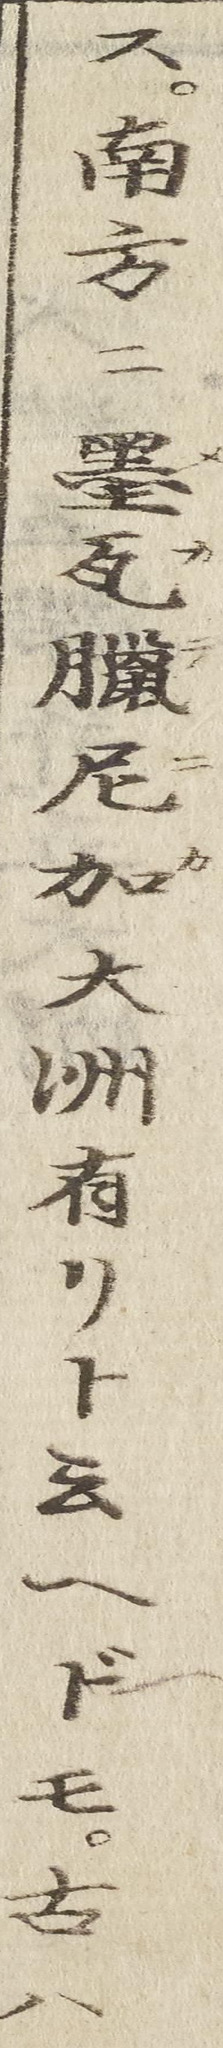ス。南方ニ墨瓦臘尼加大洲有リト云ヘドモ。古ハ
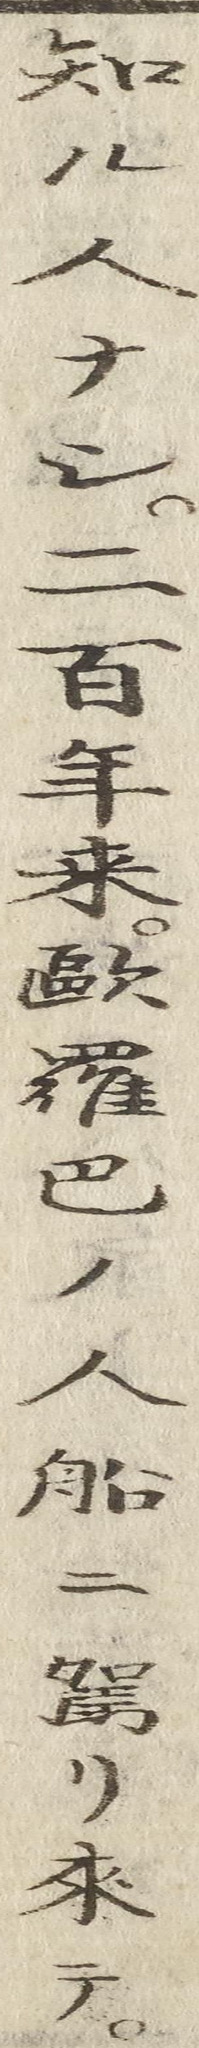知ル人ナシ。二百年来。欧羅巴ノ人船ニ駕リ来テ。
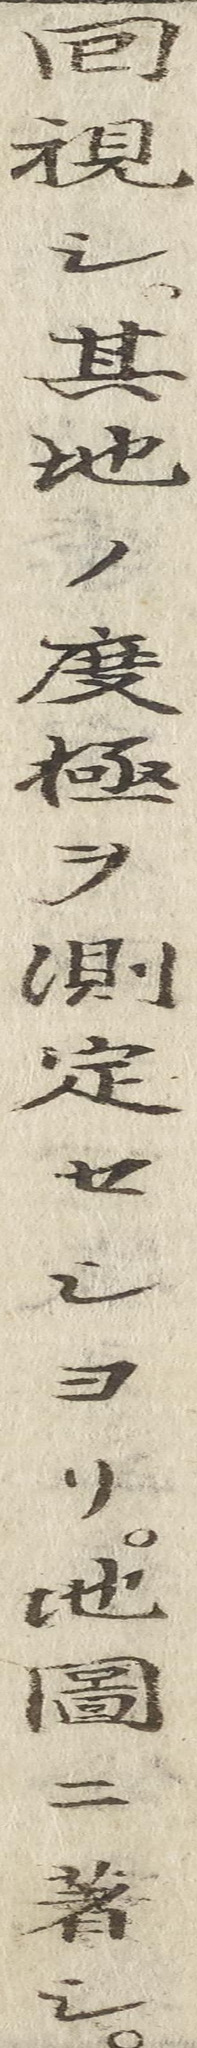回視シ。其地ノ度極ヲ測定セシヨリ。地図ニ著シ。
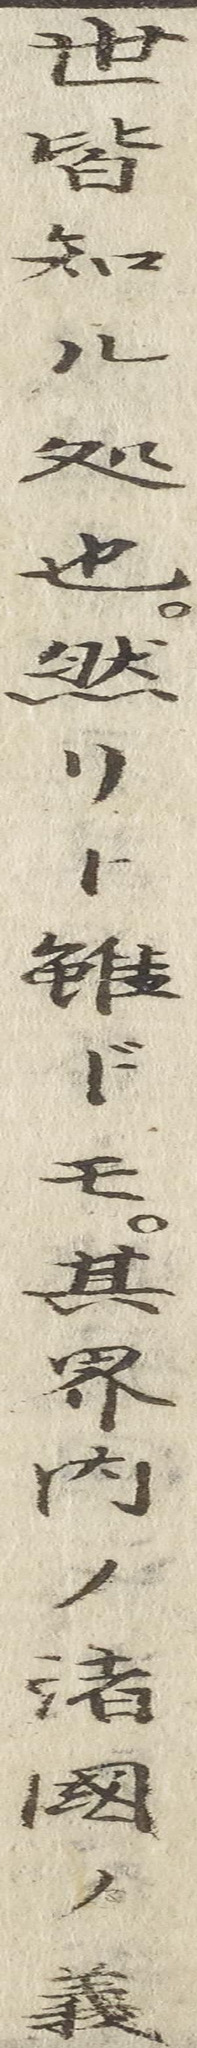世皆知ル処也。然リト雖ドモ。其界内ノ諸国ノ義
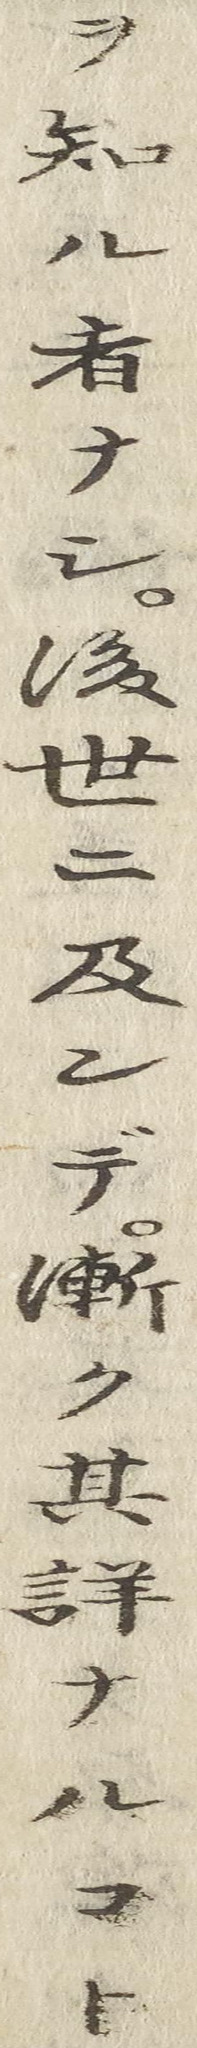ヲ知ル者ナシ。後世ニ及ンデ。漸ク其詳ナルコト
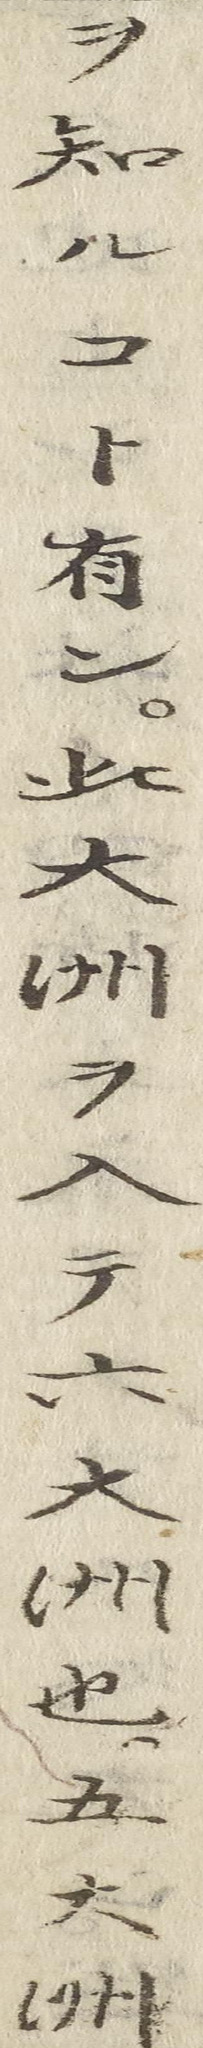ヲ知ルコト有ン。此大洲ヲ入テ六大洲也。五大洲
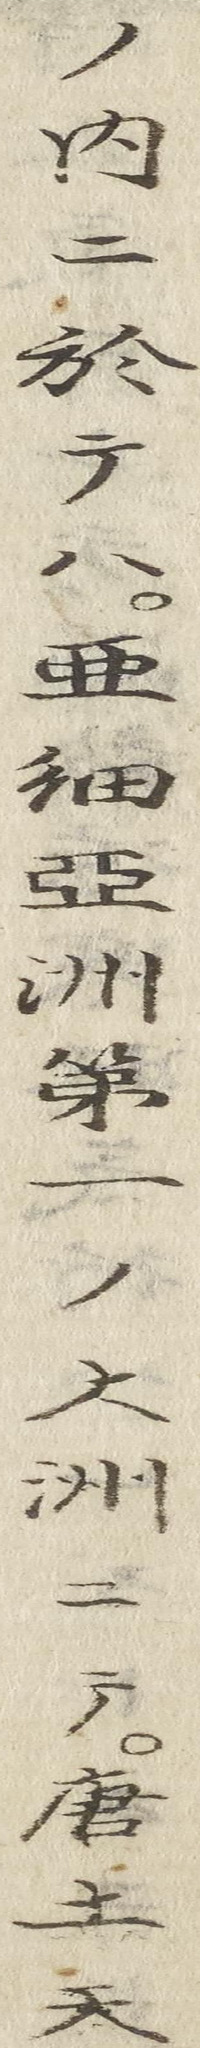ノ内ニ於テハ。亜細亜州第一ノ大洲ニテ。唐土天
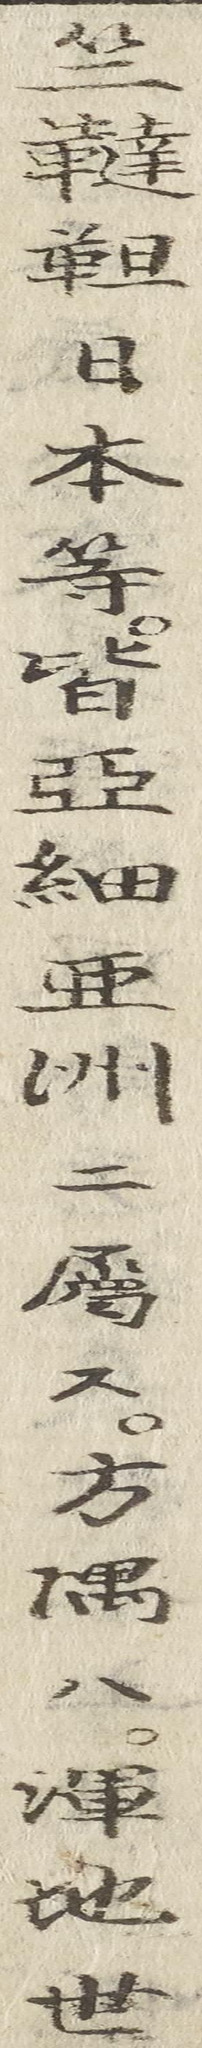竺韃靼日本等。皆亜細亜洲ニ属ス。方隅ハ。渾地世
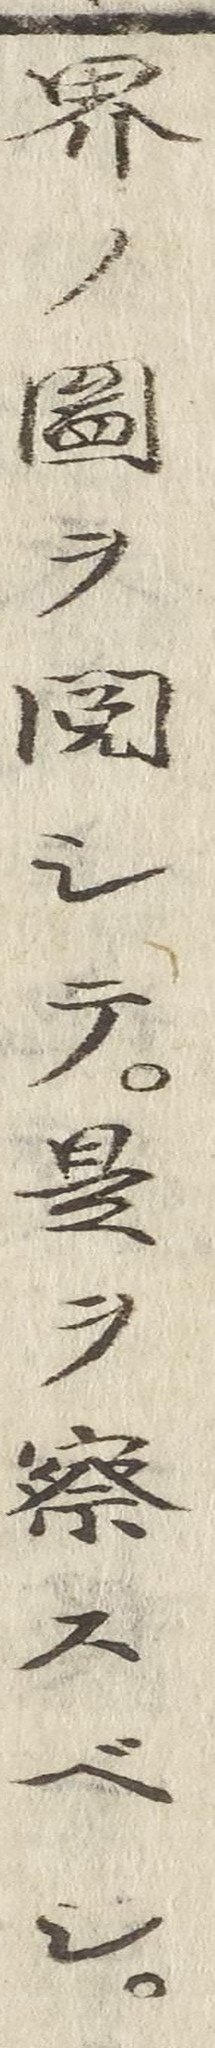界ノ図ヲ閲シテ。是ヲ察スベシ。
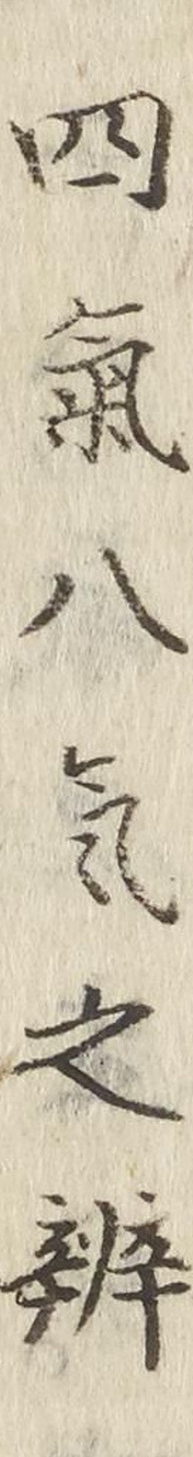四気八気之弁
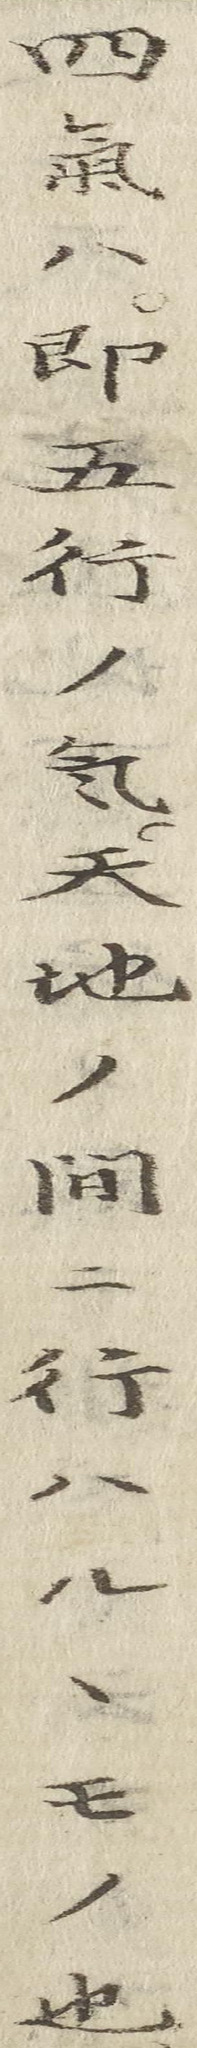四気ハ。即五行ノ気。天地ノ間ニ行ハルヽモノ也。
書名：大略天学名目鈔　天經或問附録
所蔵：東京大学地震研究所図書室 Earthquake Research Institute Library, The University of Tokyo, JAPAN
